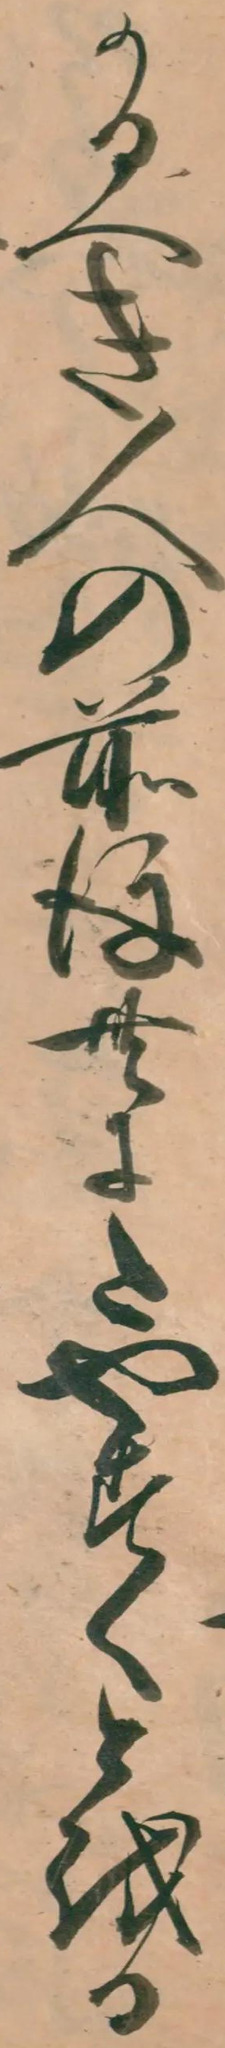かるへき人の前後無にたやすくとをる
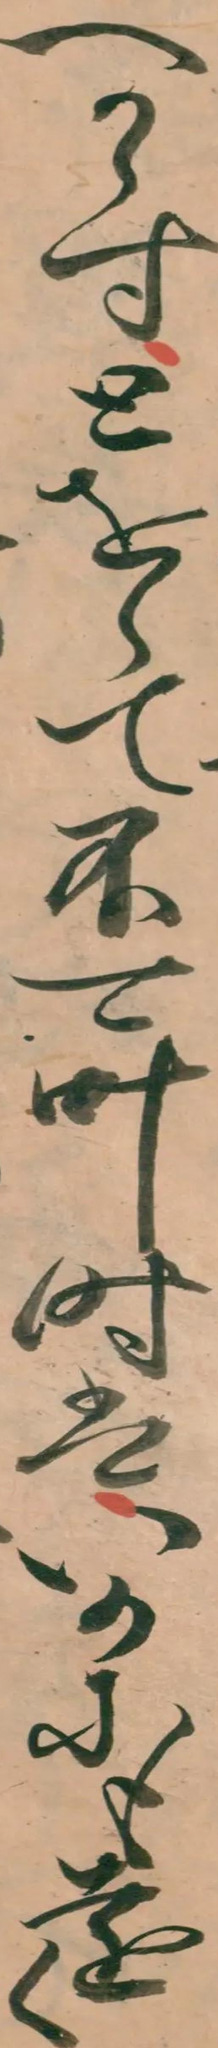へからすとをらて不可叶時はいかにも遠く
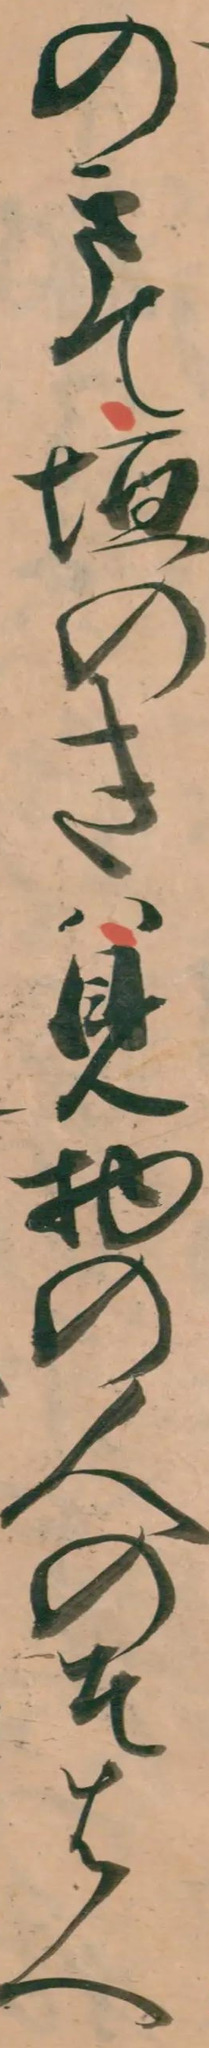のきて垣のきハ見物の人のそはへ
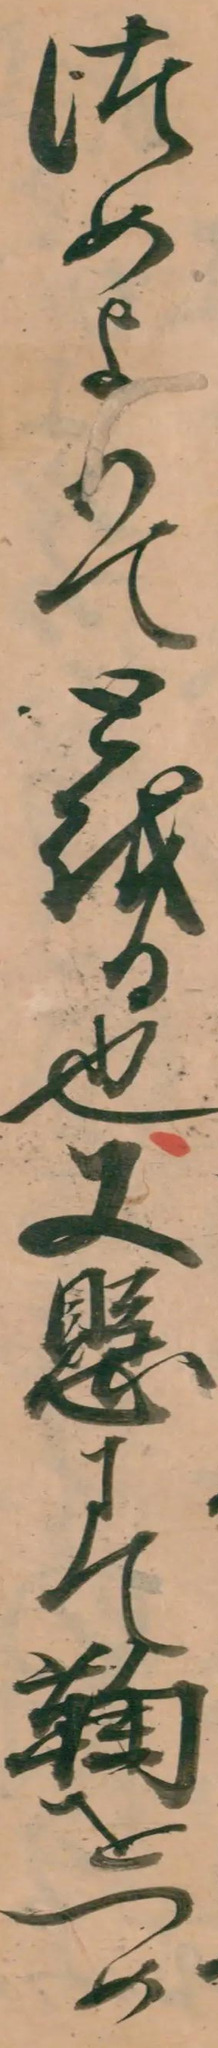つめよりてとをる也又懸にて鞠をつめ
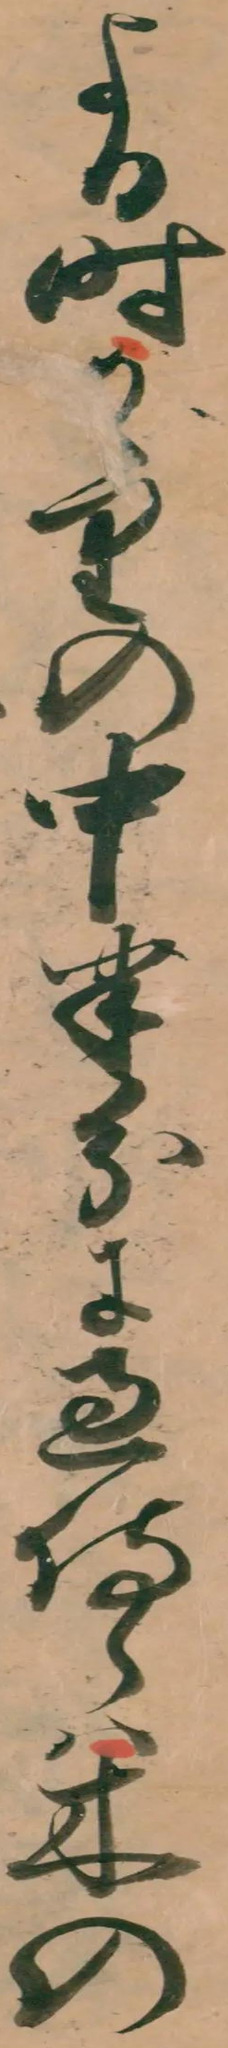よる時かゝりの中半分に過侍らハ木の
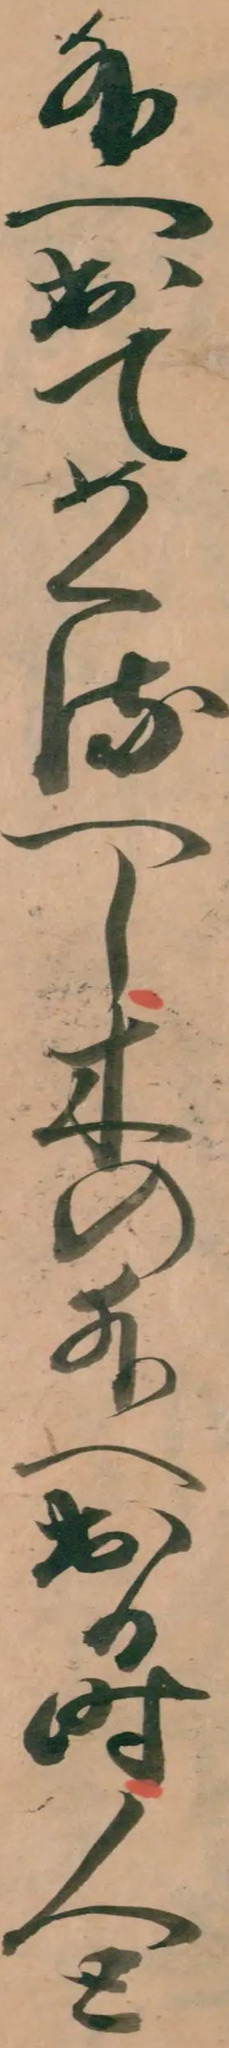外へ出てめくるへし木の外へ出る時人と
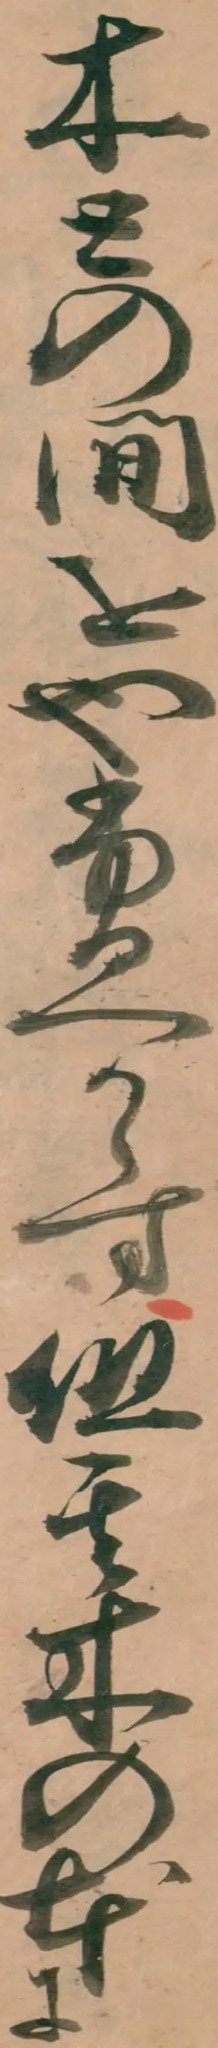木との間をやふるへからす但其木の本に
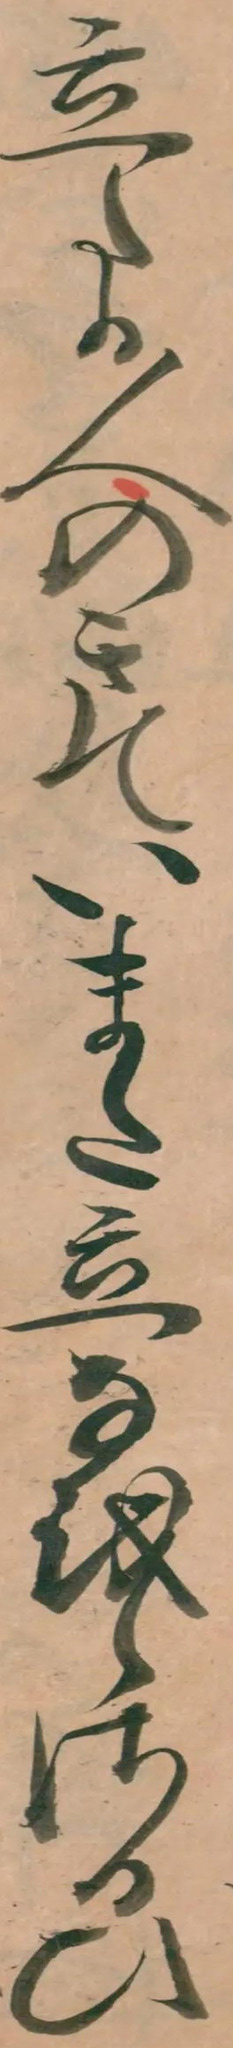立たる人のきていまた立なをらさるひ
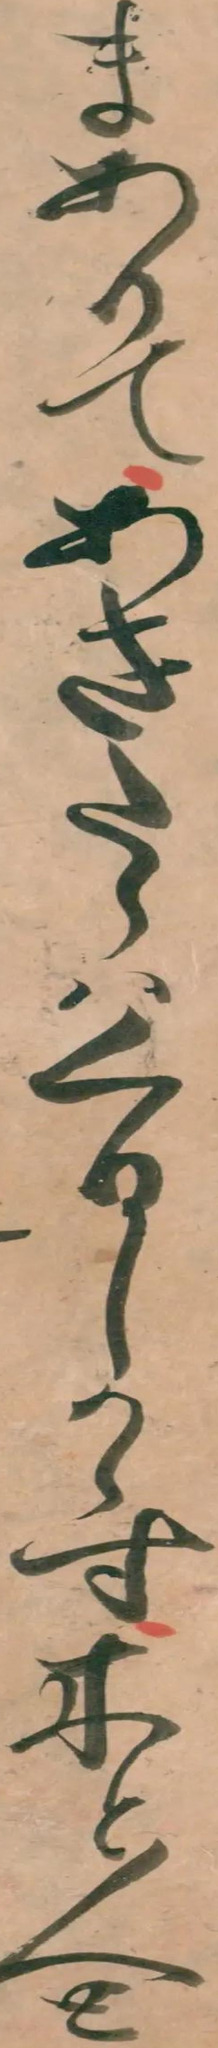まありてあきたらハくるしからす木と人と
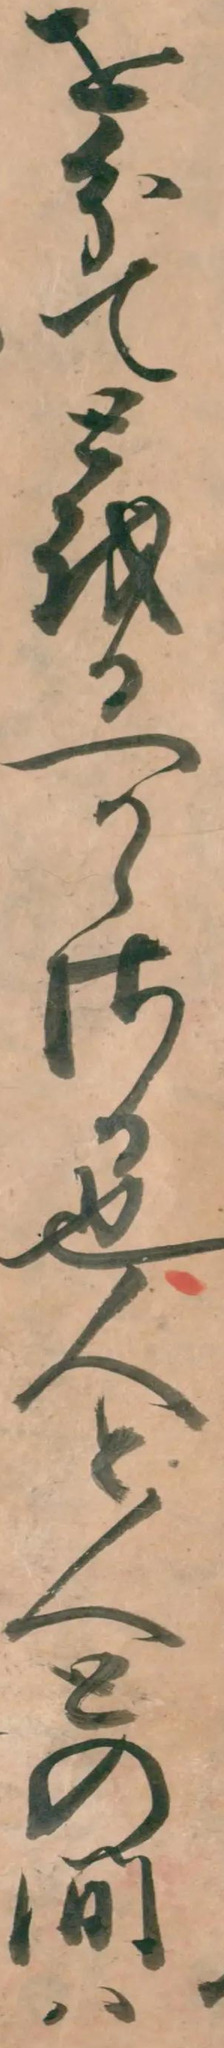を分てとをるへからさる也人と人との間ハ
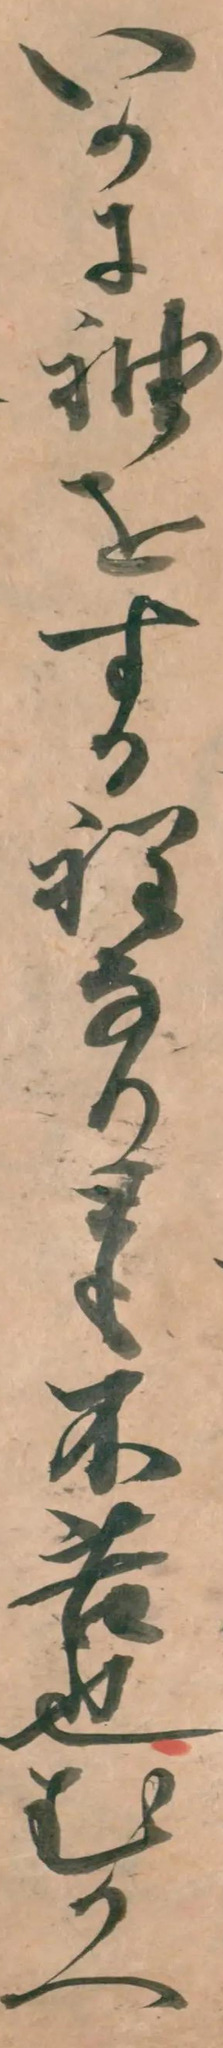いかに袖をする程なりとも不苦也むかへ
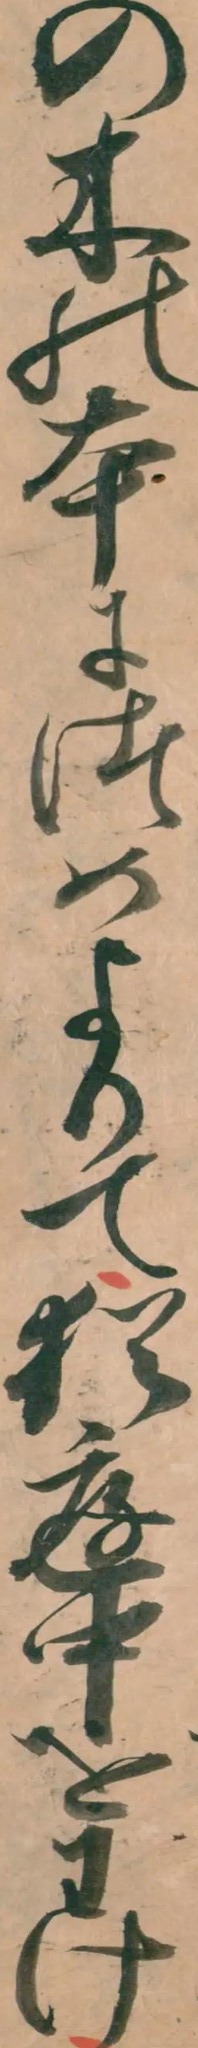の木の本につめよりて猶庭中をわけ
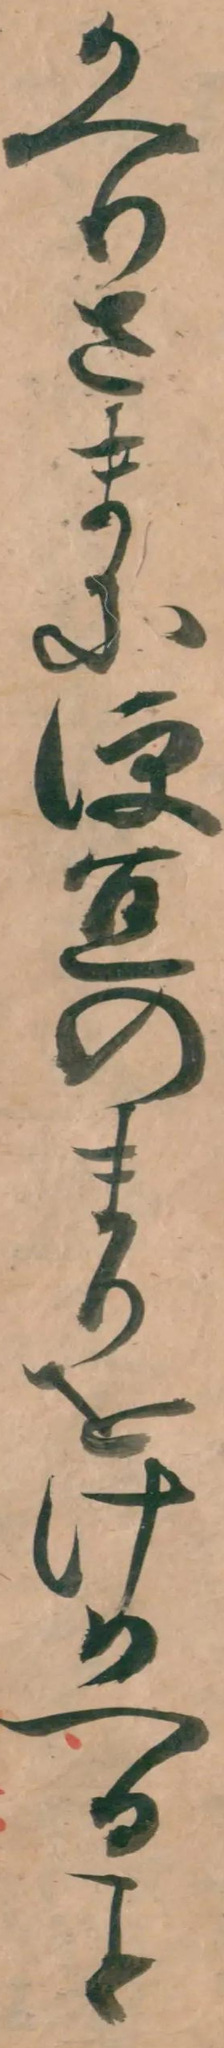かへりさまに便宜のまりをけかへること

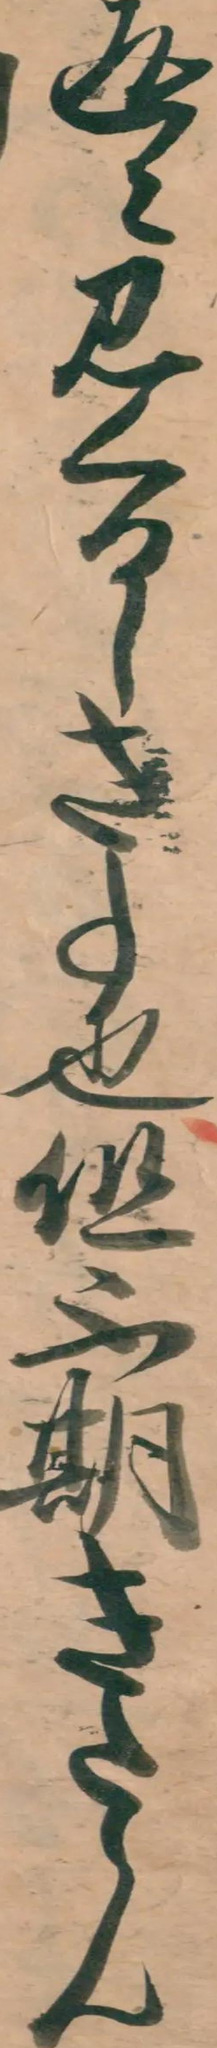返々見くるしき事也但不期きたらん
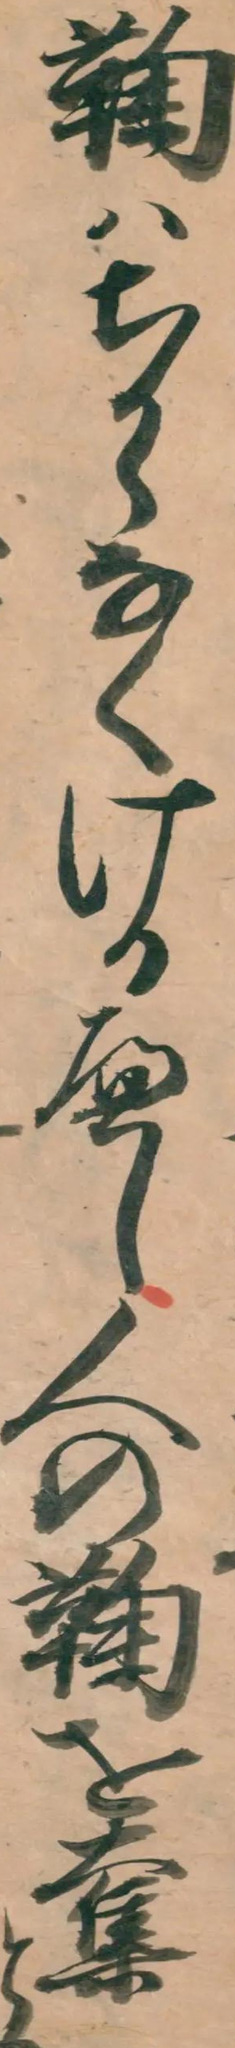鞠ハちからなくけるへし人の鞠を奪とる
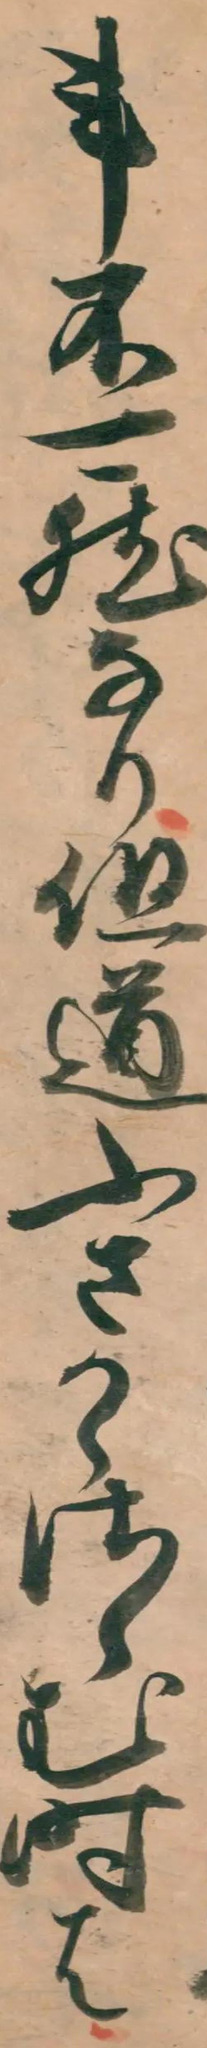事不可然なり但道ふさからさらむ時は
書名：蹴鞠之条々大概
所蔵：国立国会図書館 National Diet Library, JAPAN
